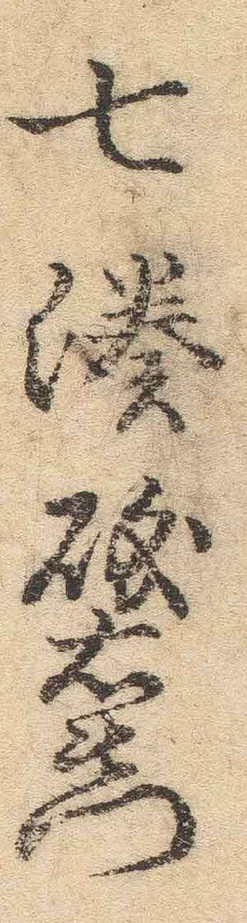七湊磯右衛門
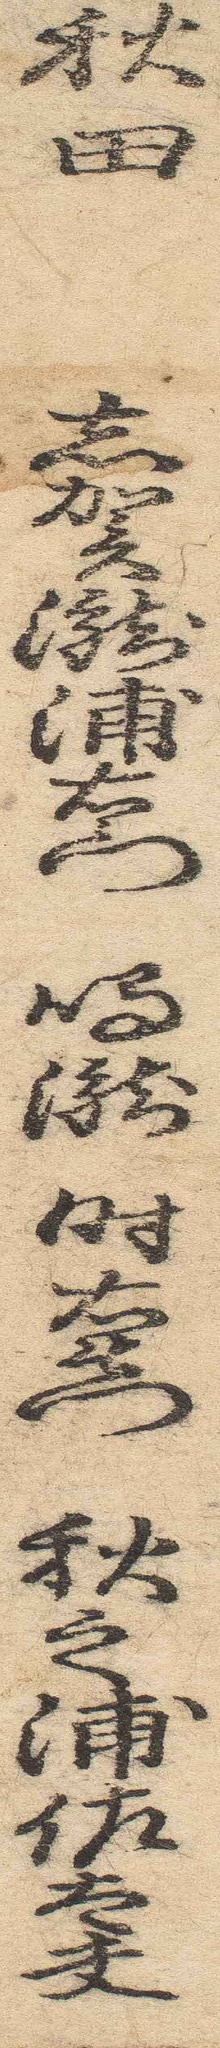秋田志賀瀧浦右衛門鳴瀧時右衛門秋之浦佐太夫
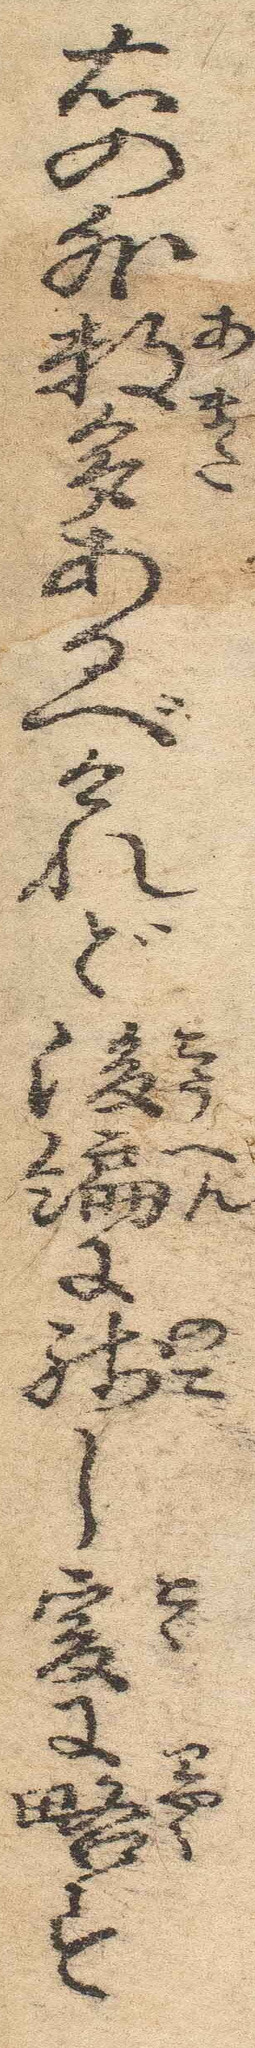右の外数多あるべけらど後編に残し爰に略す
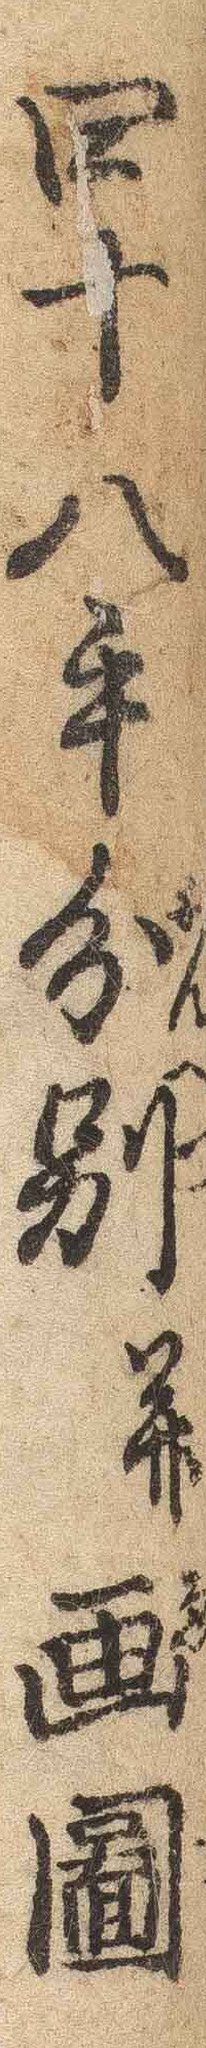四十八手分別并画圖
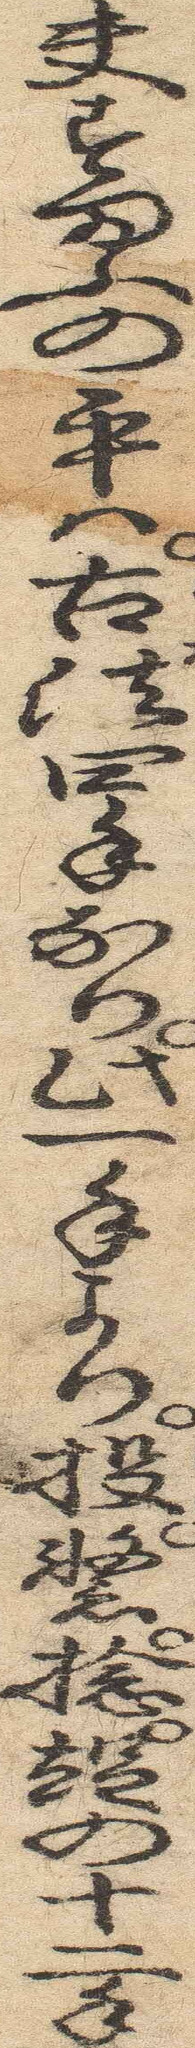夫すまふの手ハ。古法四手なり。此一手より。投。懸。捻。超の十二手
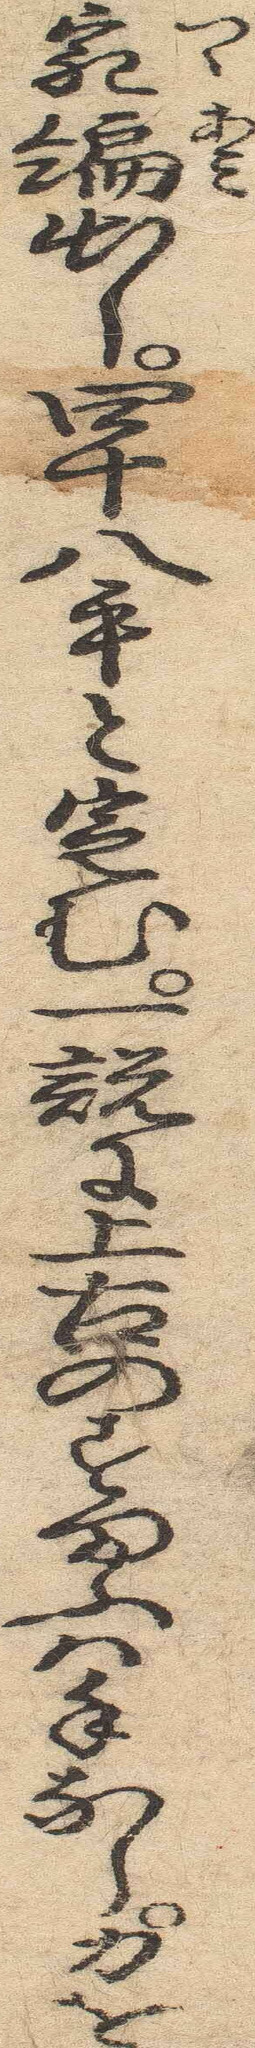宛編出し。四十八手と定む。一説に上古のすまふハ手なし。力を
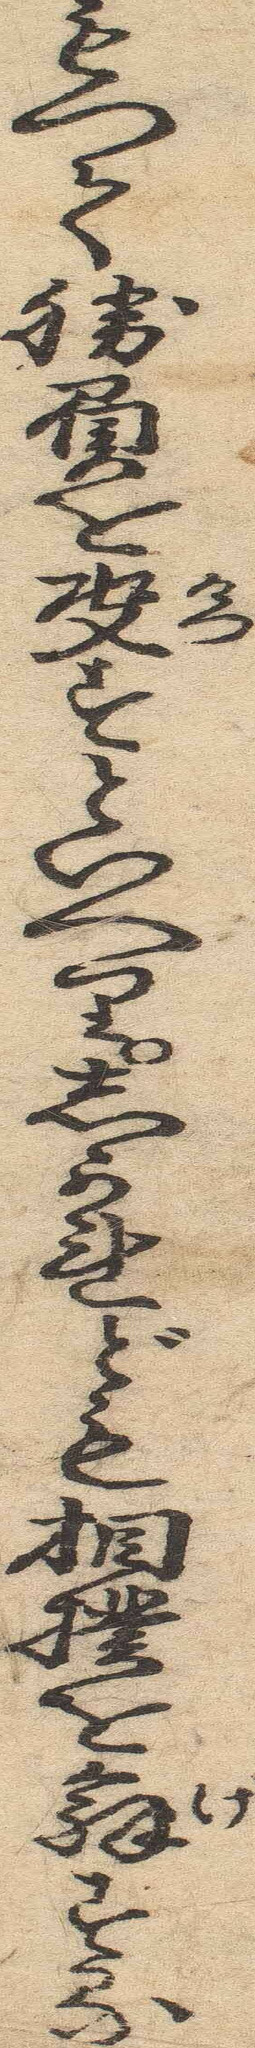もつて勝負を決すといへり。しかれども相撲を解する
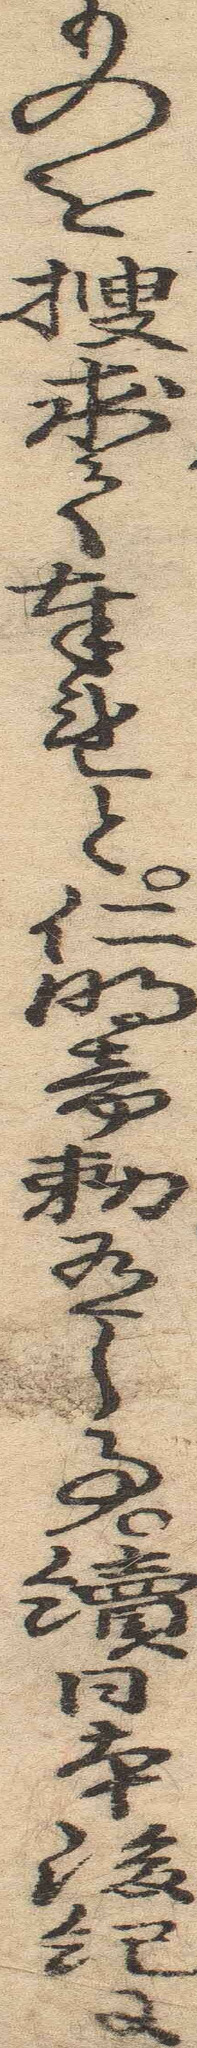ものを捜求て達れと仁明帝勅有し事。続日本後記に
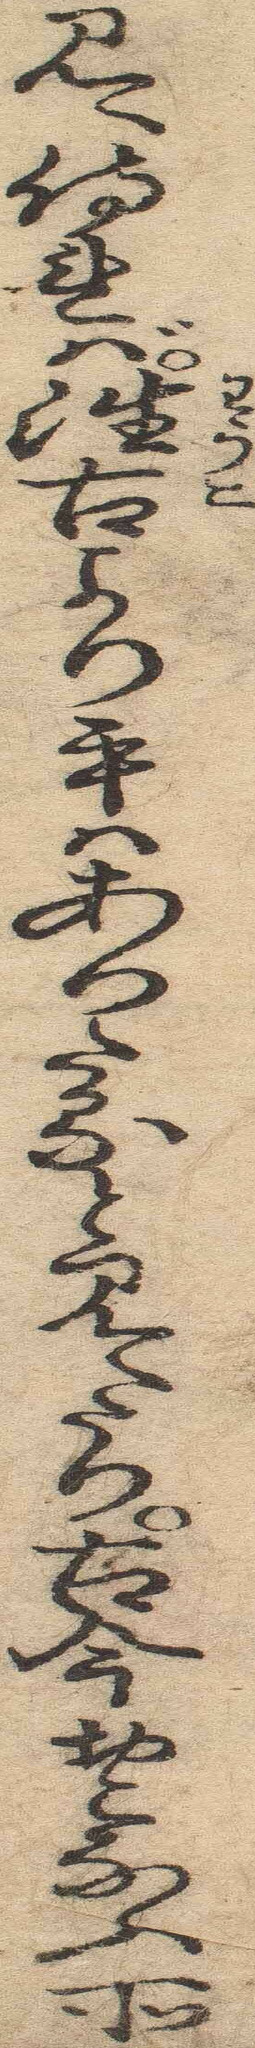見へ侍れバ。往古より手ハありたると見へたり。古今おこふ所
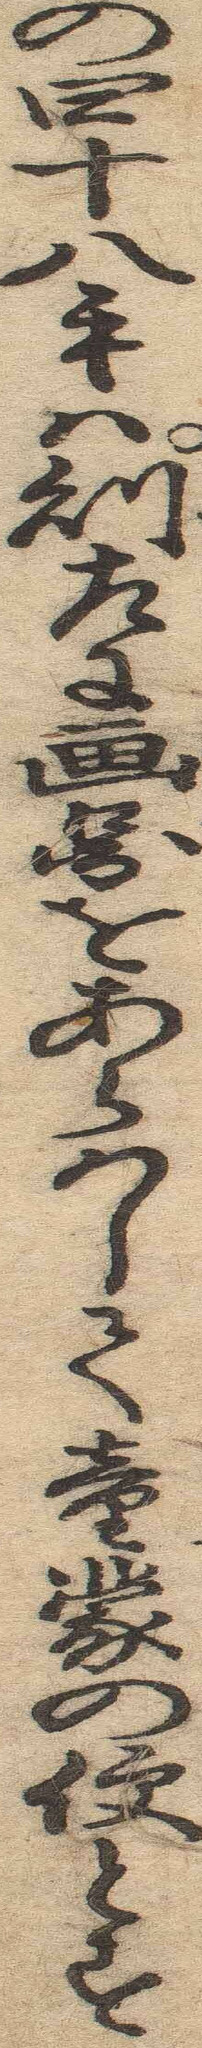の四十八手ハ則左に画圖をあらハして童蒙の便とす

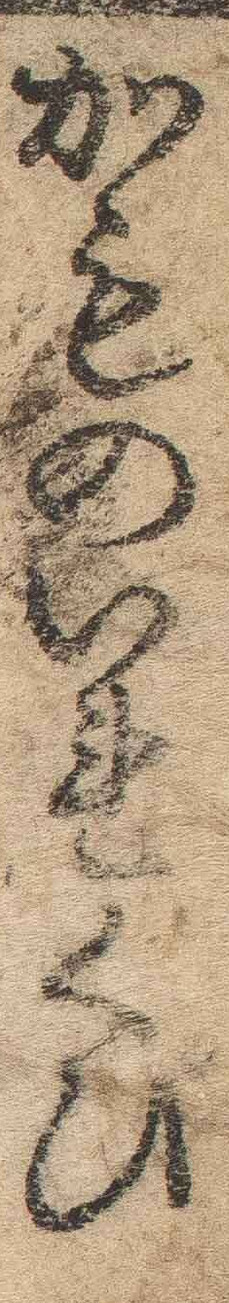かものいれくび
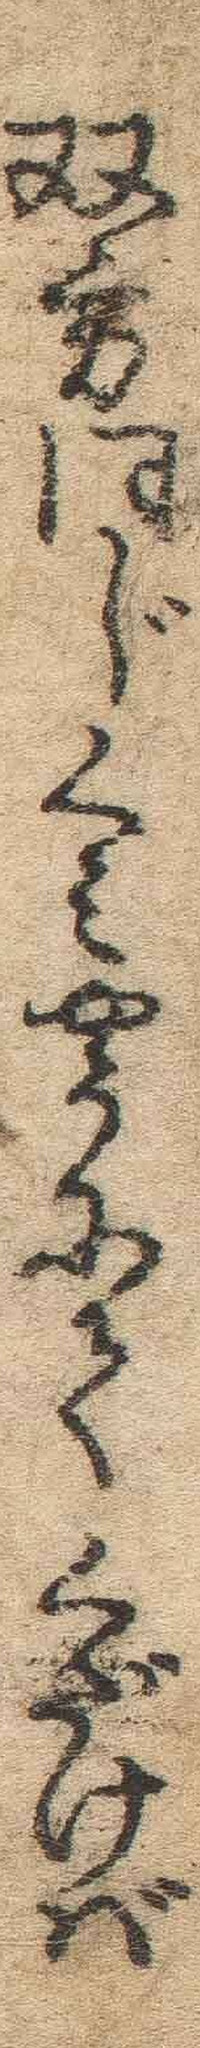双方同じくみやうにてくだけば
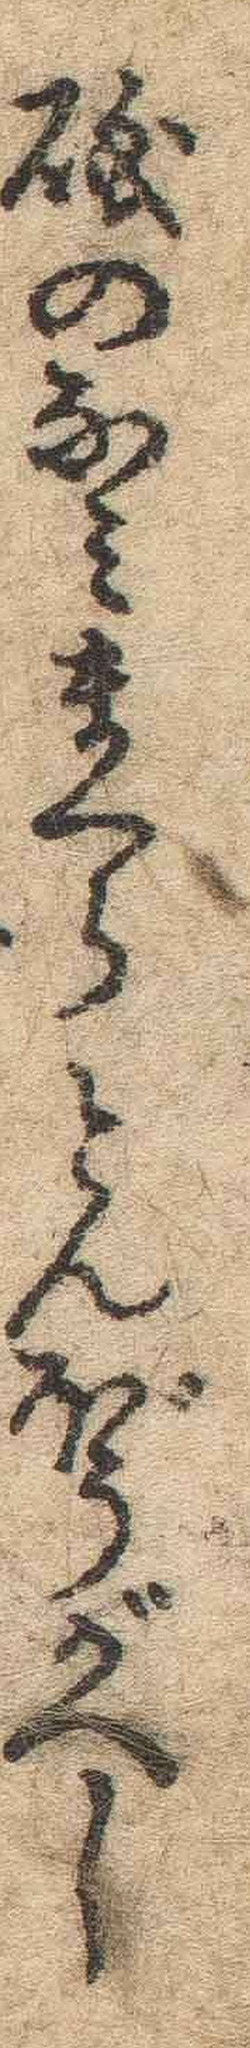磯のなみまくらとん法がへし
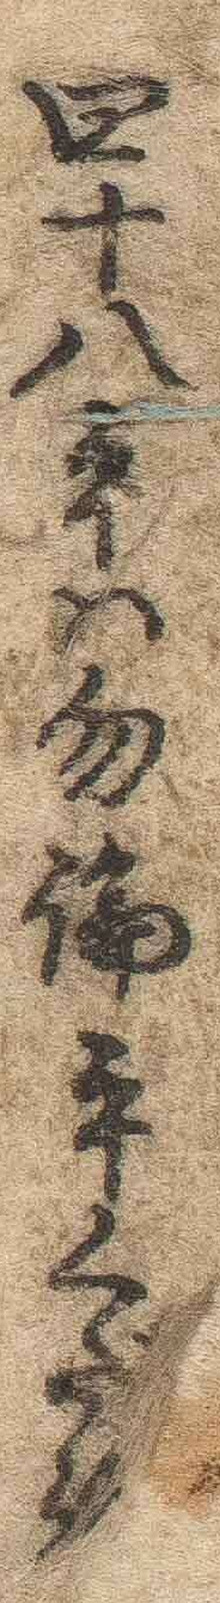四十八手は勿論手くだき
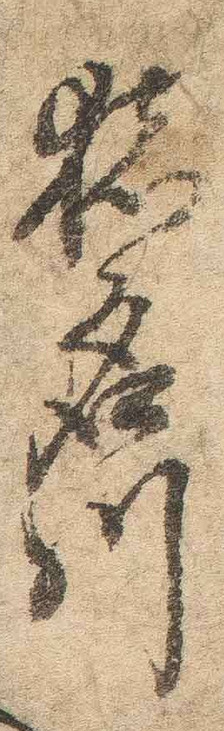猪名川
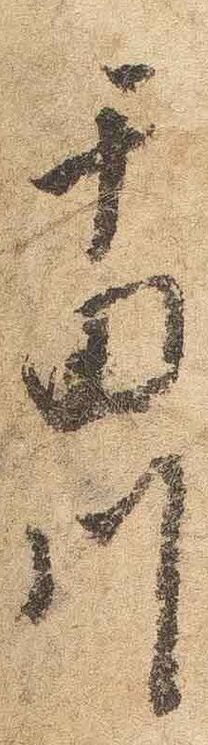千田川
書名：古今相撲大全
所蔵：東京学芸大学附属図書館 国文学研究資料館
